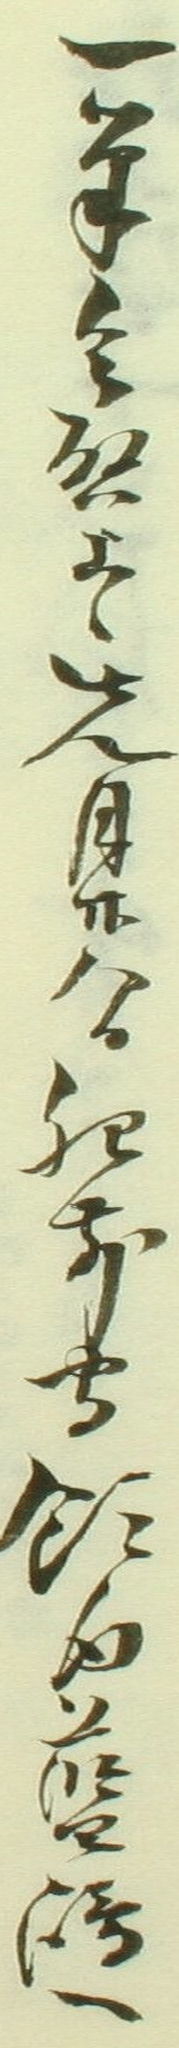一筆令啓上候先月廿八日肥前守領内藍嶋へ
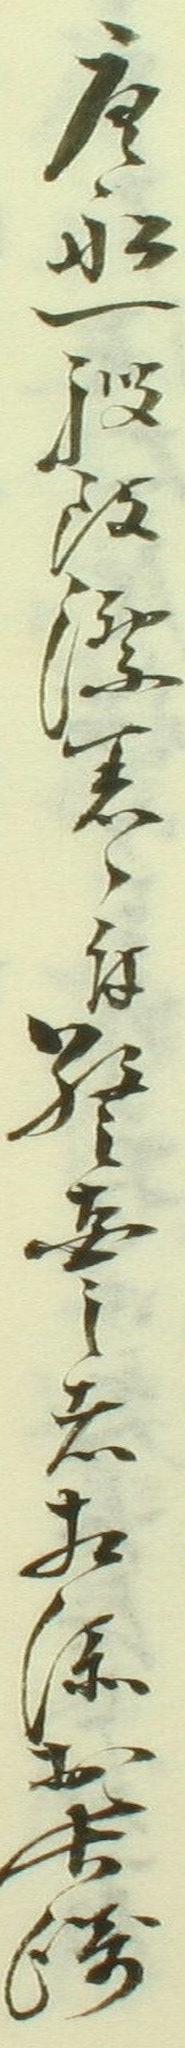唐船一艘致漂着候付警固之者相添於長崎
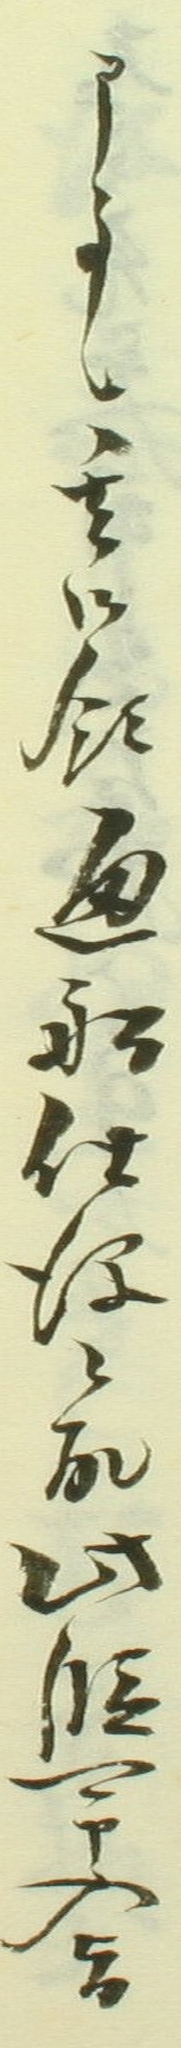申事候其御領通船仕儀候故此段可申入旨
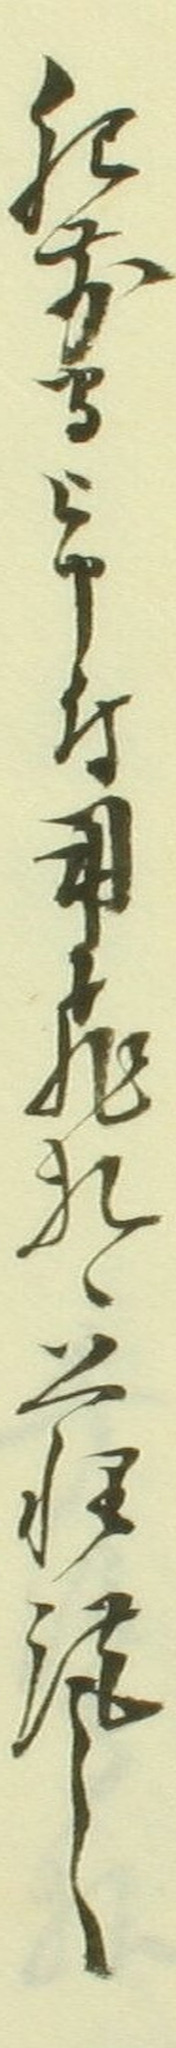肥前守被申付用飛札候恐惶謹言
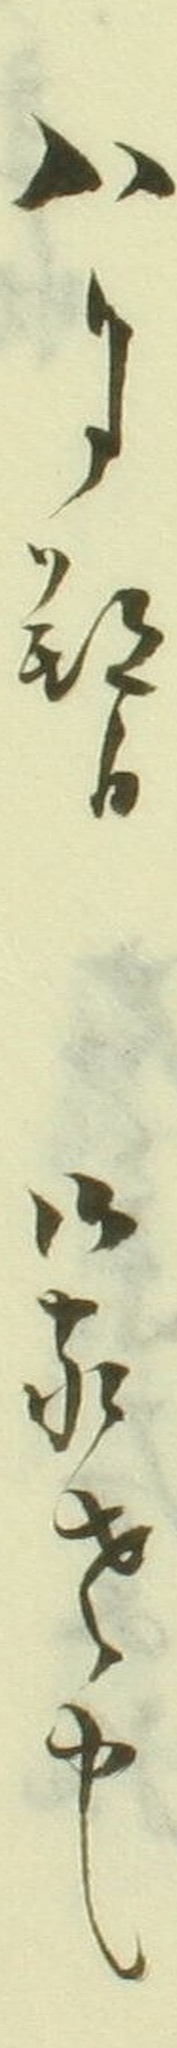八月朔日御家老中
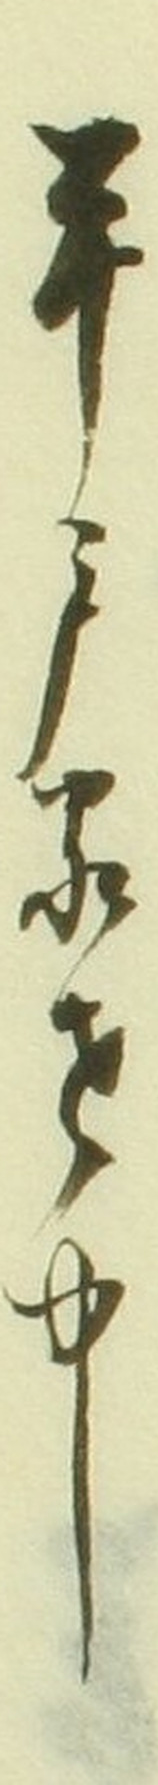平戸家老中
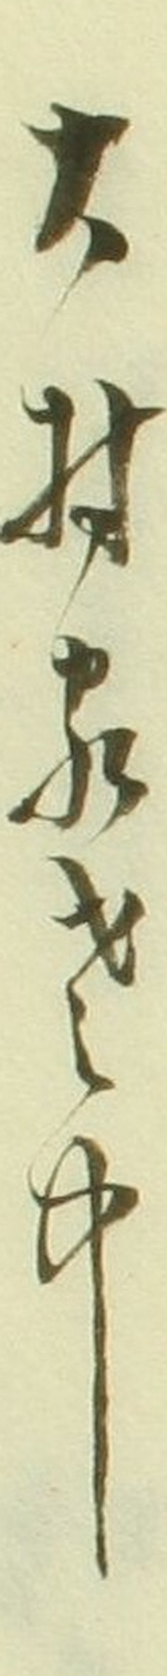大村家老中
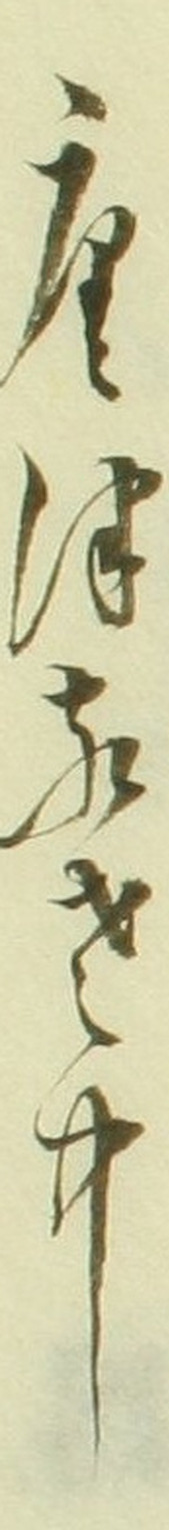唐津家老中
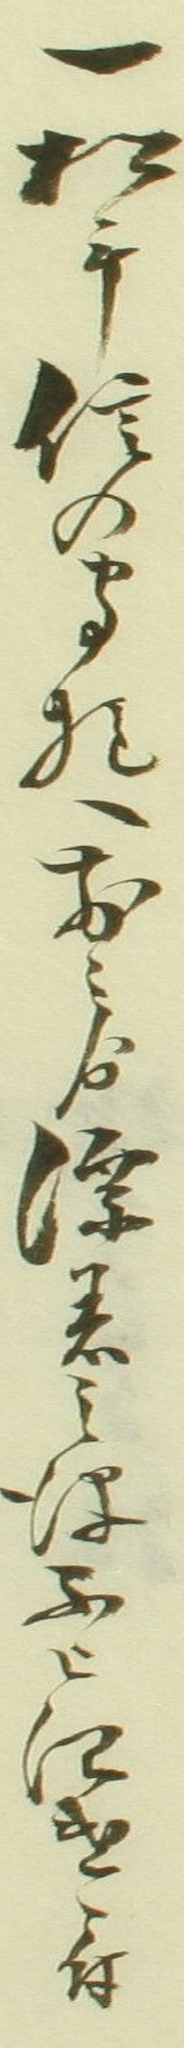一松平信の守様へ前々ゟ漂着之儀不被仰遣ニ付
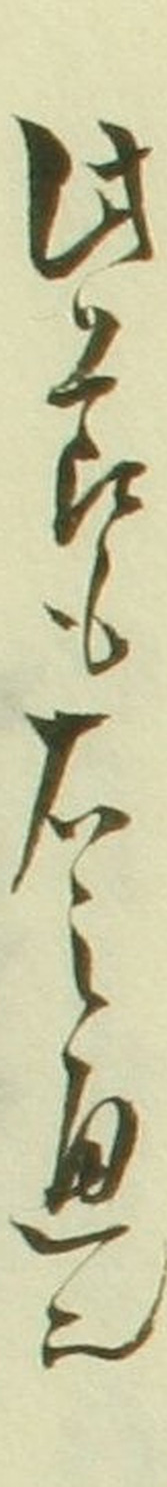此節も右之通也
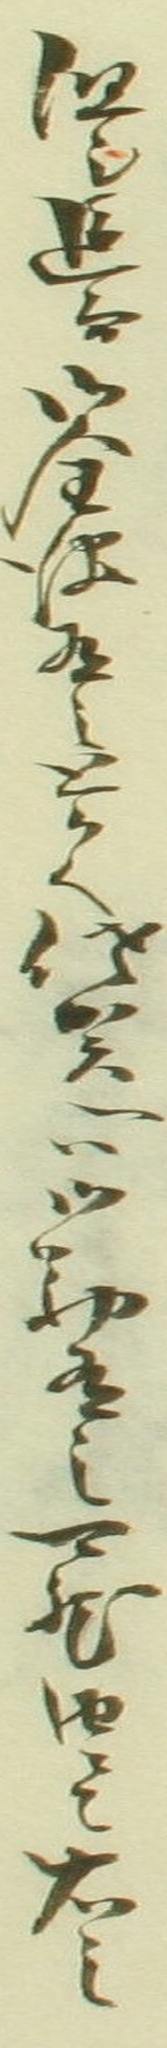但シ追々御詮議有之とかく佐賀へハ御勤有之可然由ニて右之
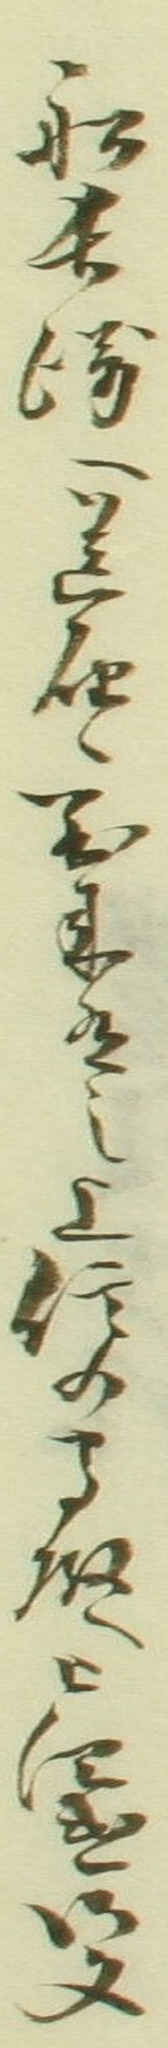船長崎へ送届候到来有之上信の守殿へ被仰遣御文

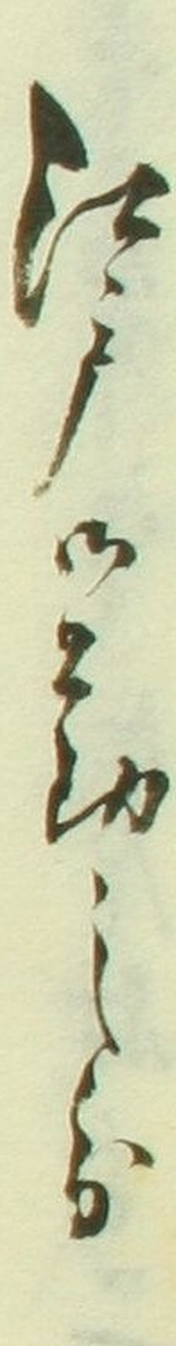江戸御勤之分
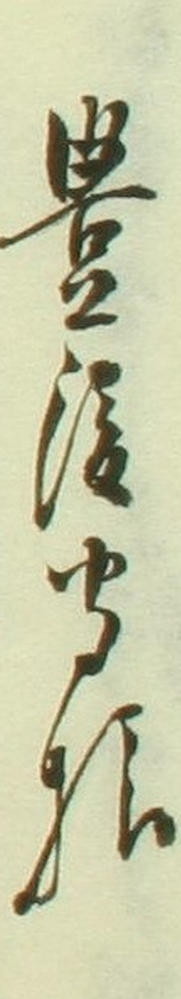豊後守様
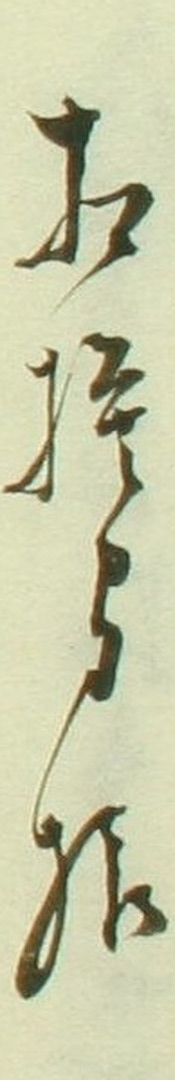相模守様
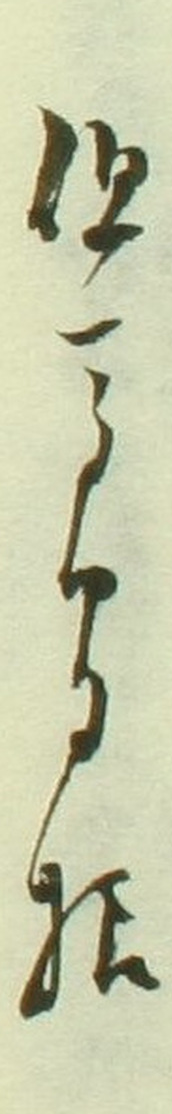但馬守様
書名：異国船漂着記
